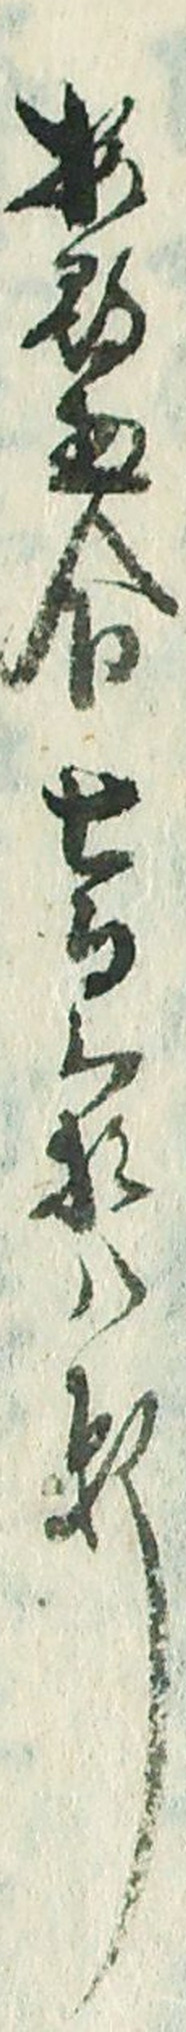拾郡惣合七百拾八軒
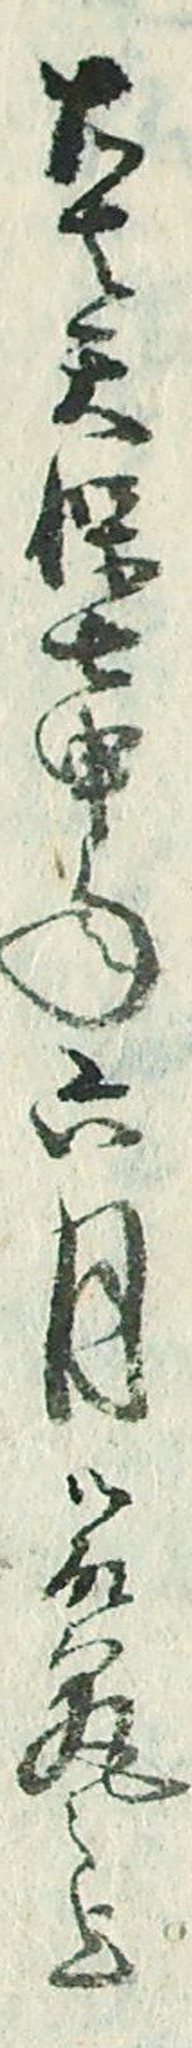右者天保七申年六月御取究之上
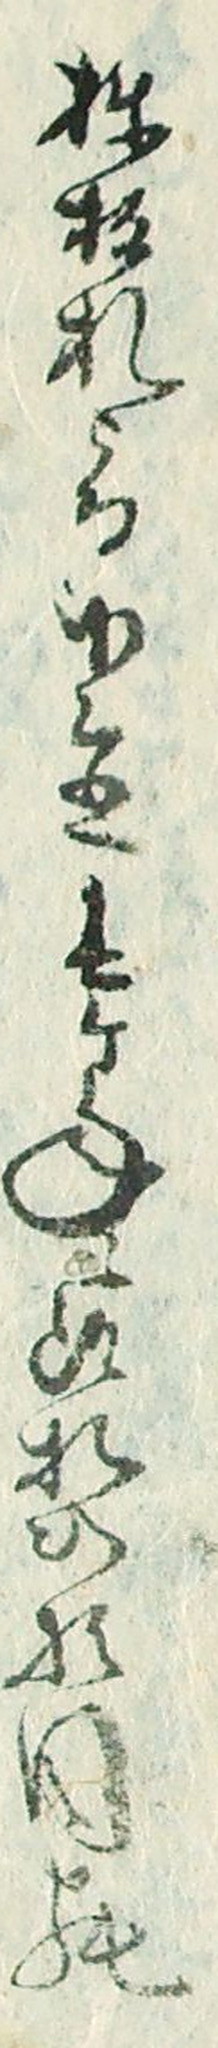株板札被為下置壱ケ年ニ銀札弐拾目宛
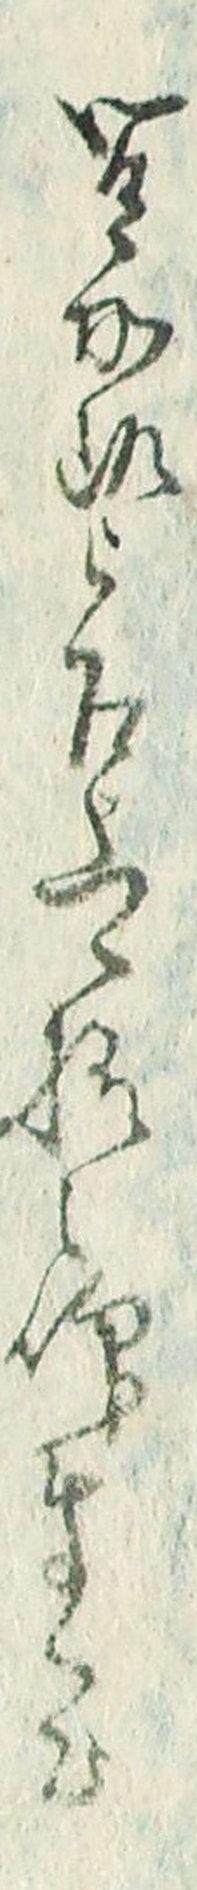冥加銀被召上候様被仰付候以上

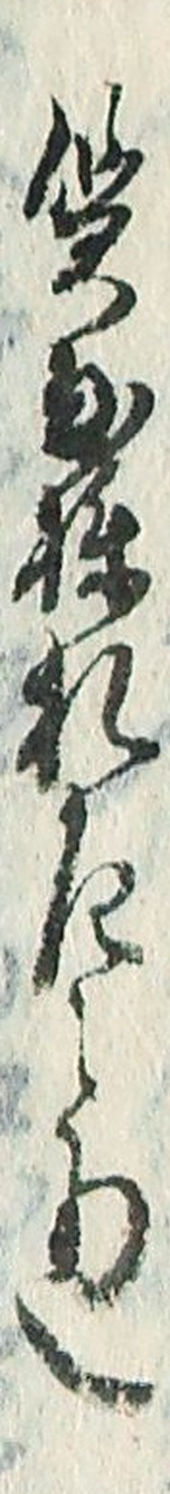質屋株札左之通

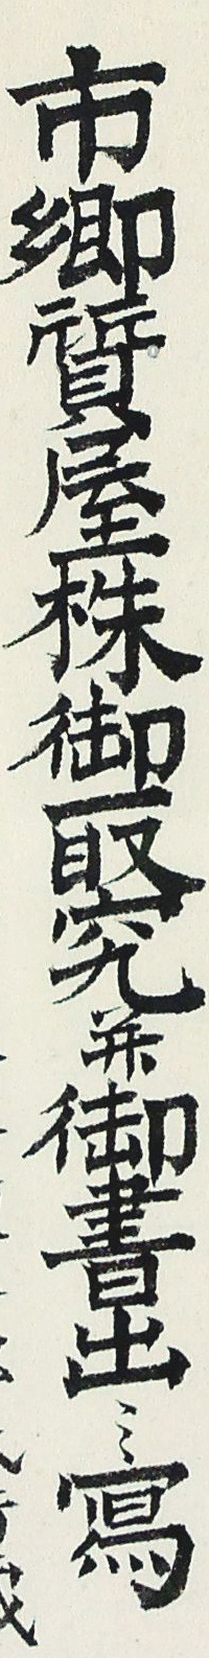「市郷質屋株御取究幷御書出之寫
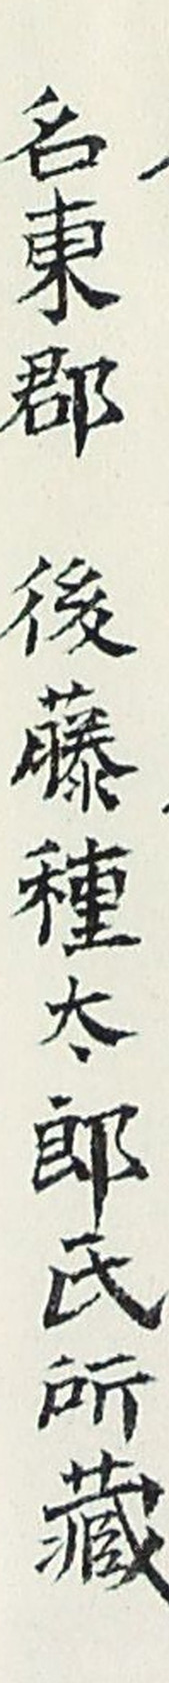名東郡後藤種太郎氏所蔵」

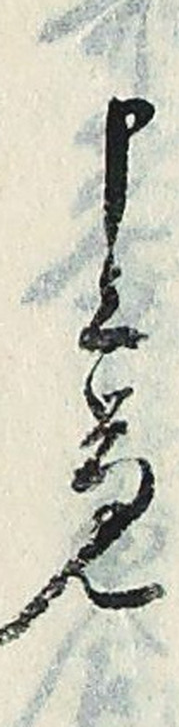申上覚
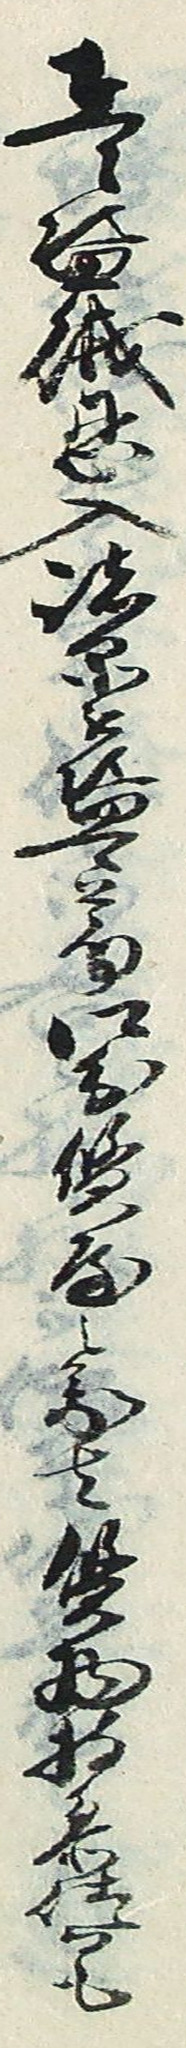在々盗賊忍入諸品被盗候節郷分質屋之義者質物持参仕候而も
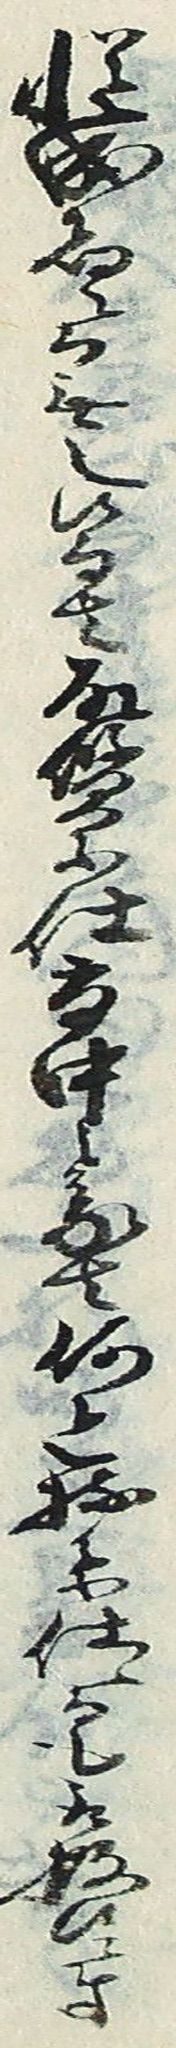慥成者ニ而無之候而者取質不仕市中之義者何を持参仕候而も取扱候ニ付
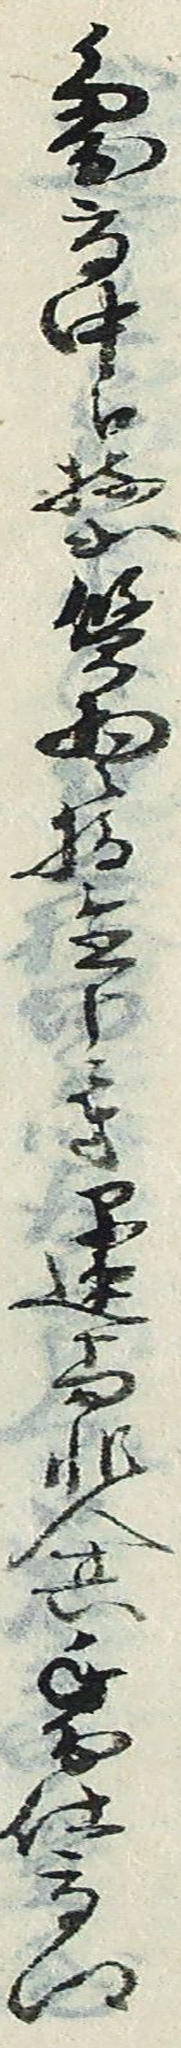多分市中江持出質物之ニ指置申ニ付早速番非人共手分仕市郷
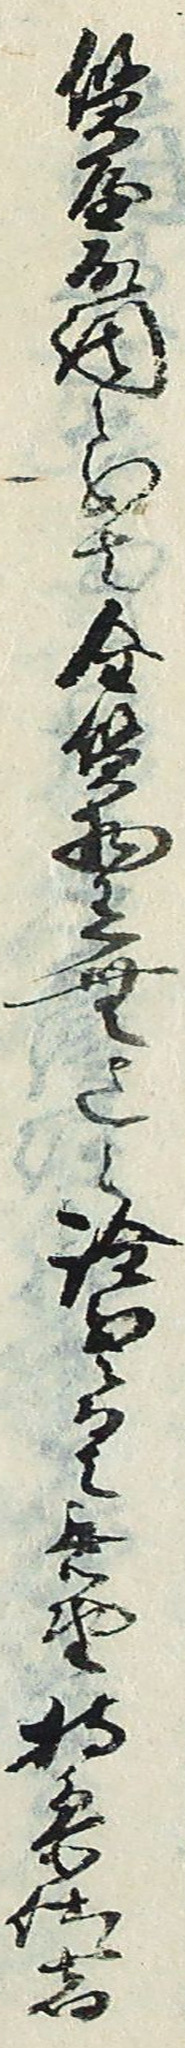質屋取調之義者全質物有無迄之詮義ニ而者無御坐持参仕候者
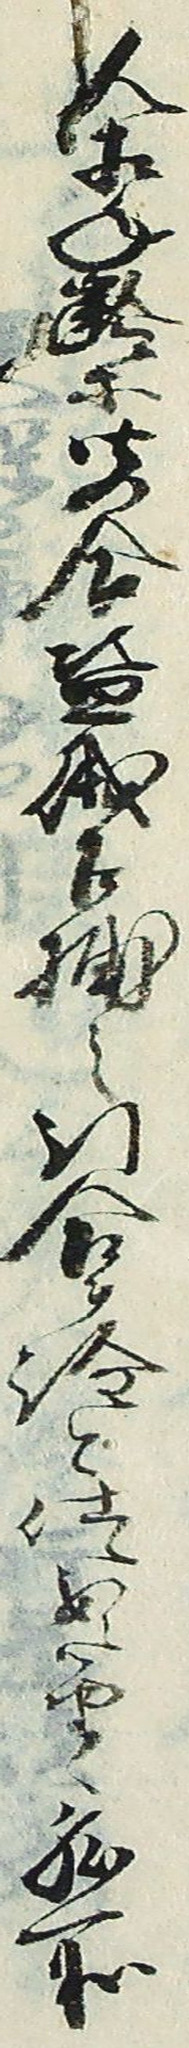人相年齢等聞合盗賊召捕之引合ヲ詮可仕候義ニ御坐候然所
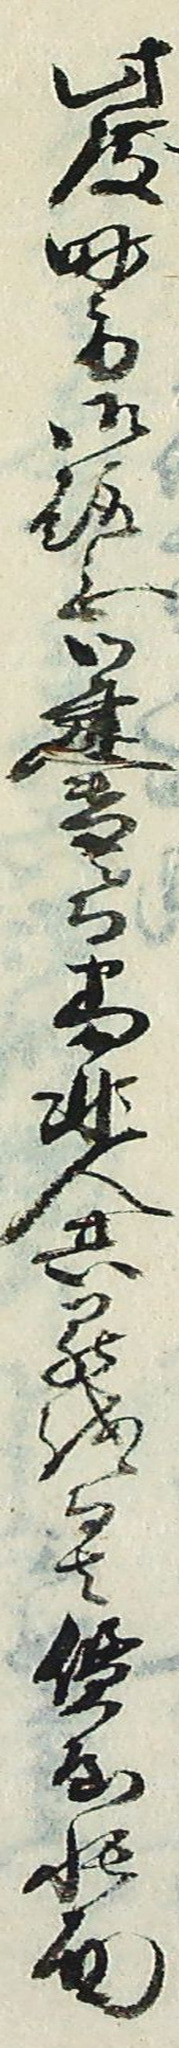此度町方御趣意御建替ニ而番非人共罷越候而者質屋帳面
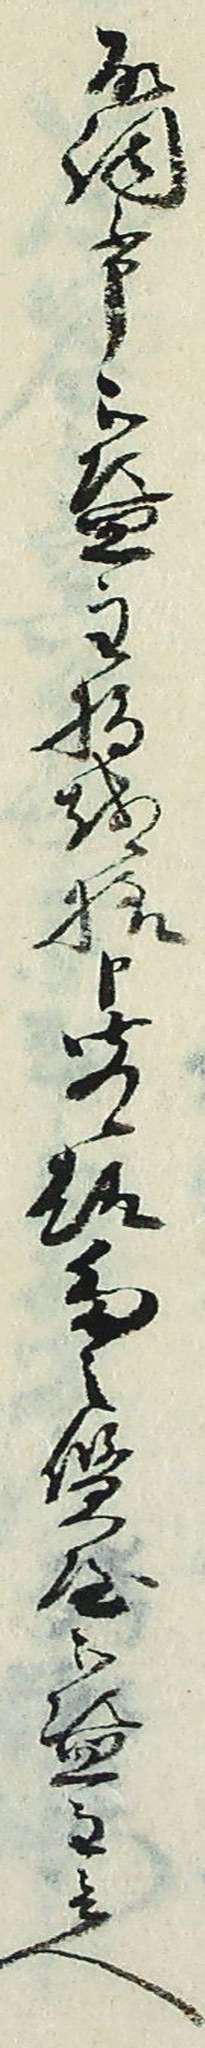取調不申被盗主指越候様申聞候趣多之質屋被盗主壱人
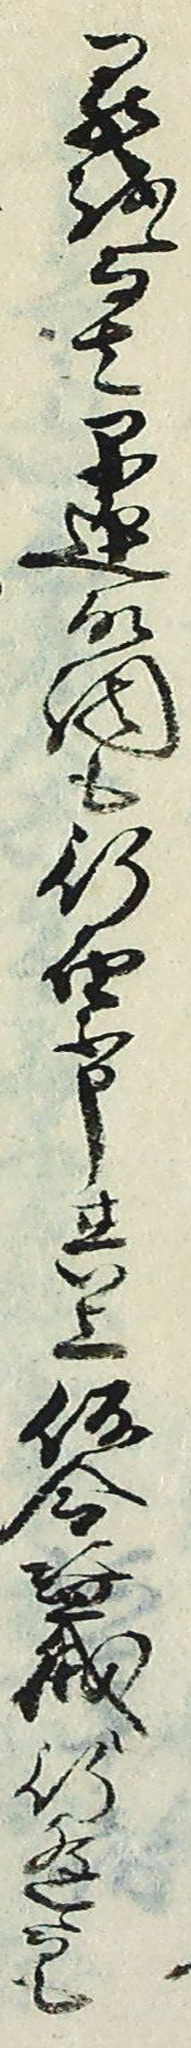罷越候而者早速取調も行届不申其上仮令盗賊ニ行逢候而も
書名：市郷質屋株御取究並御書出御趣法之写
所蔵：鳴門教育大学 Naruto University of Education
